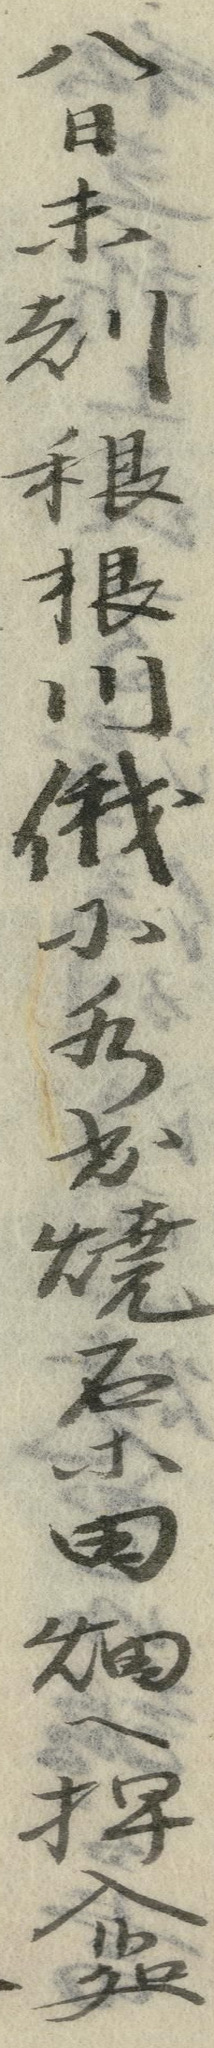八日未刻根根川俄に水出焼石等田畑へ押入候処
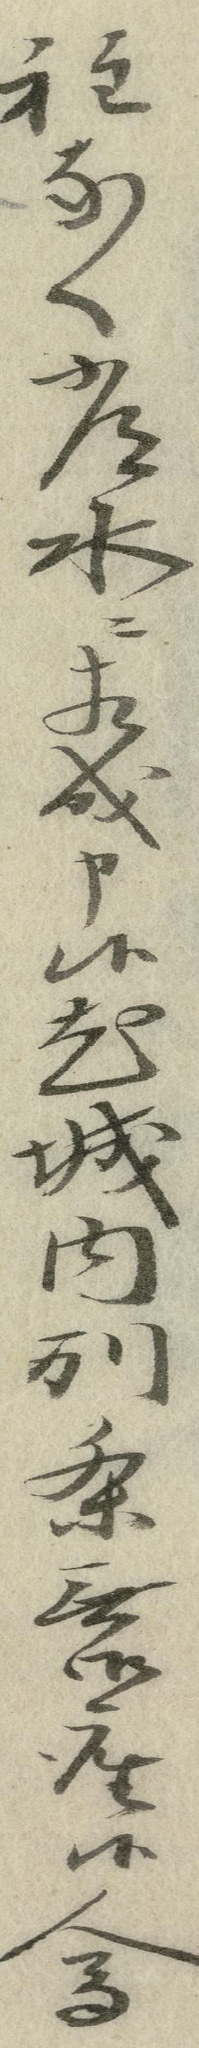程なく常水ニ相成申候尤城内別条無御座候人馬
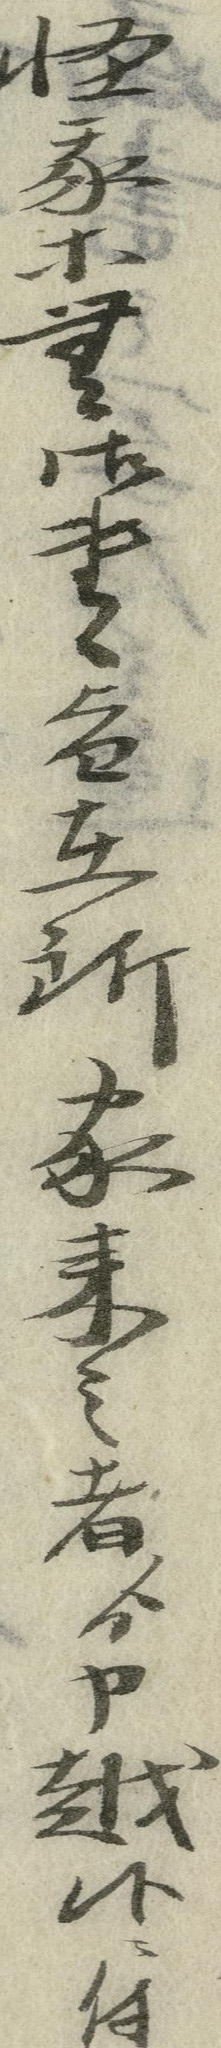怪我等無御坐候旨在所家来之者ゟ申越候ニ付
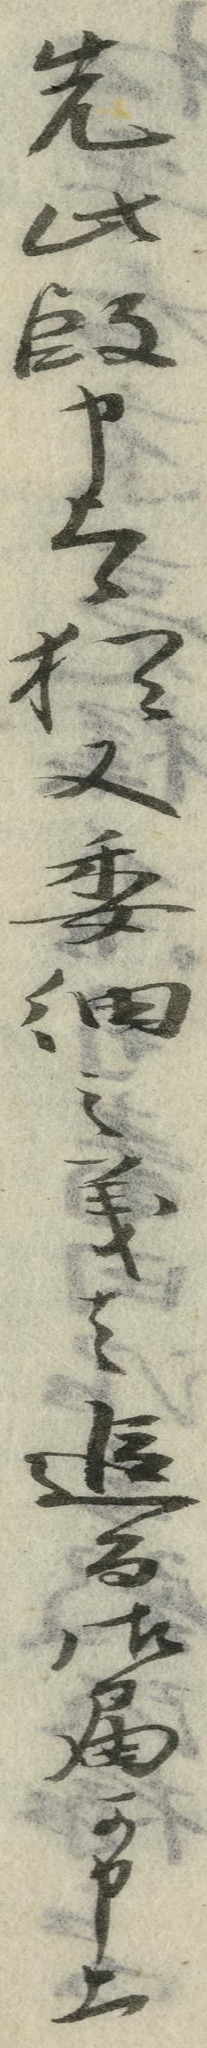先此段既申上候猶又委細之義者追而御届可申上
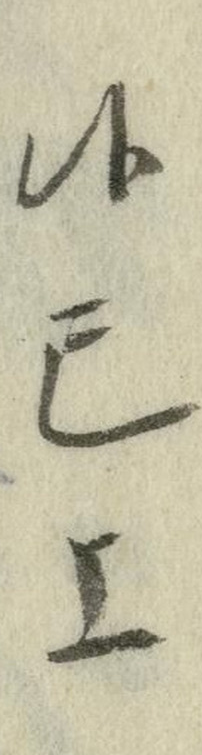候已上
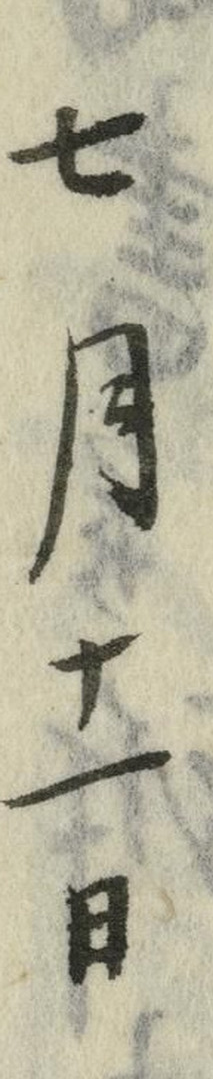七月十一日
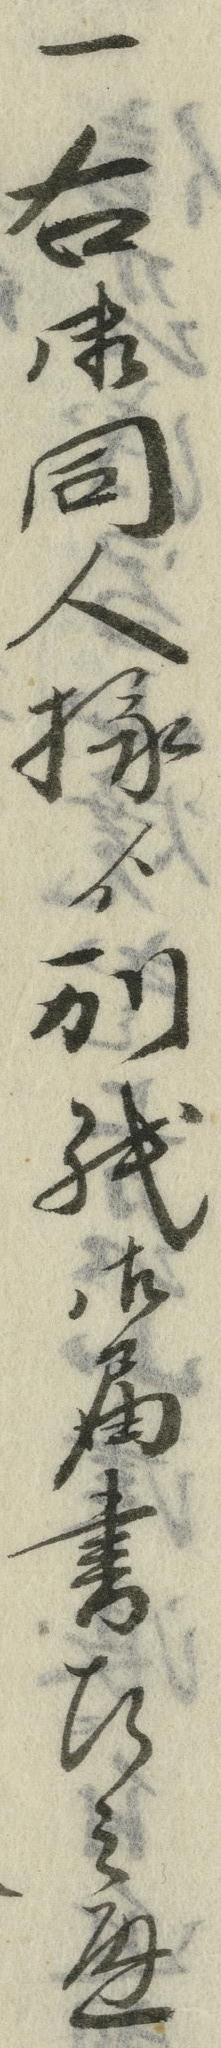一右御同人様ゟ別紙御届書左之通
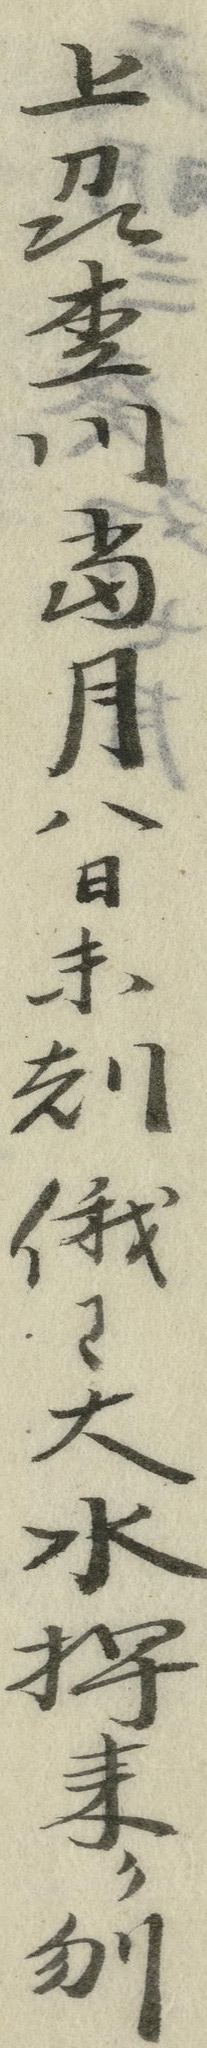上州杢川当月八日未刻俄に大水押来り刎
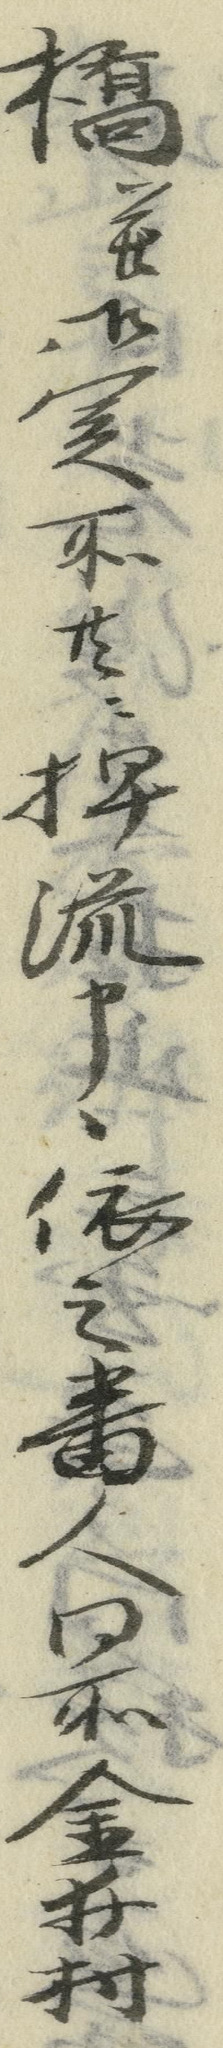橋并御関所共二押流申候依之番人同所金井村
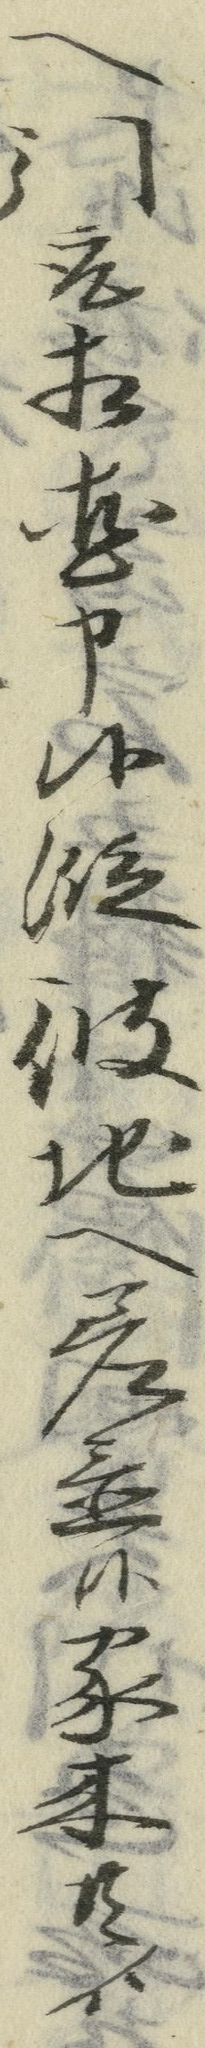へ引取相置申候段彼地へ差置候家来共ゟ
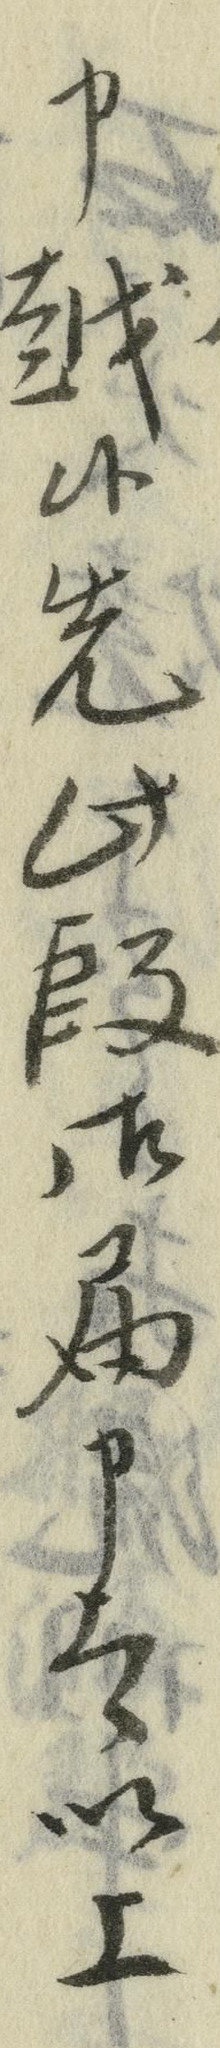申越候先此段御届申上候以上
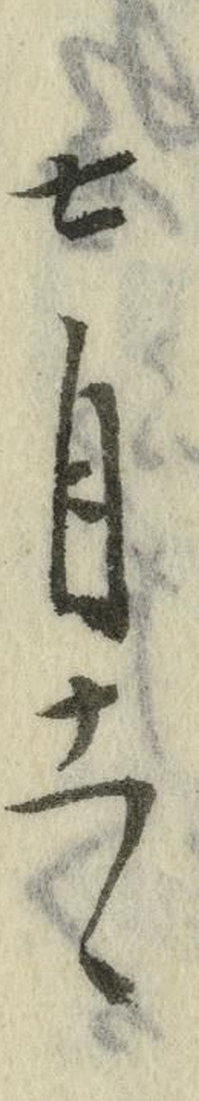七月十一日
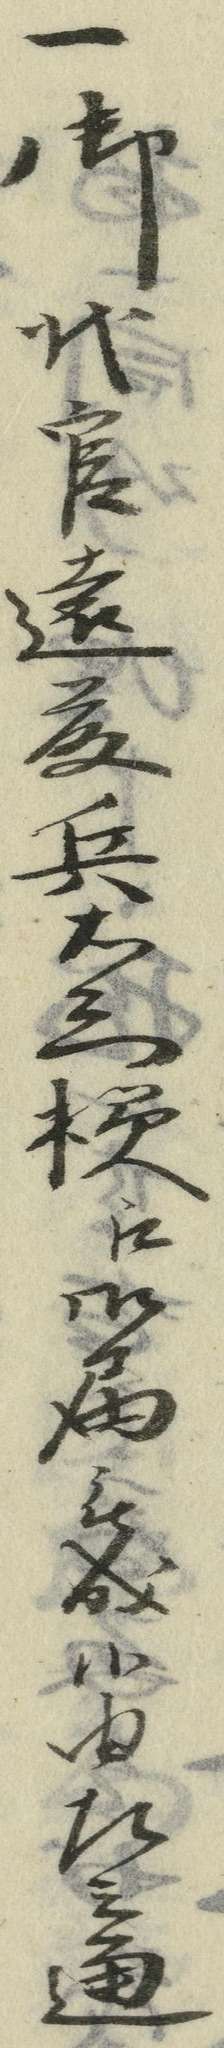一御代官遠藤兵衛門様江御届被成候由左之通
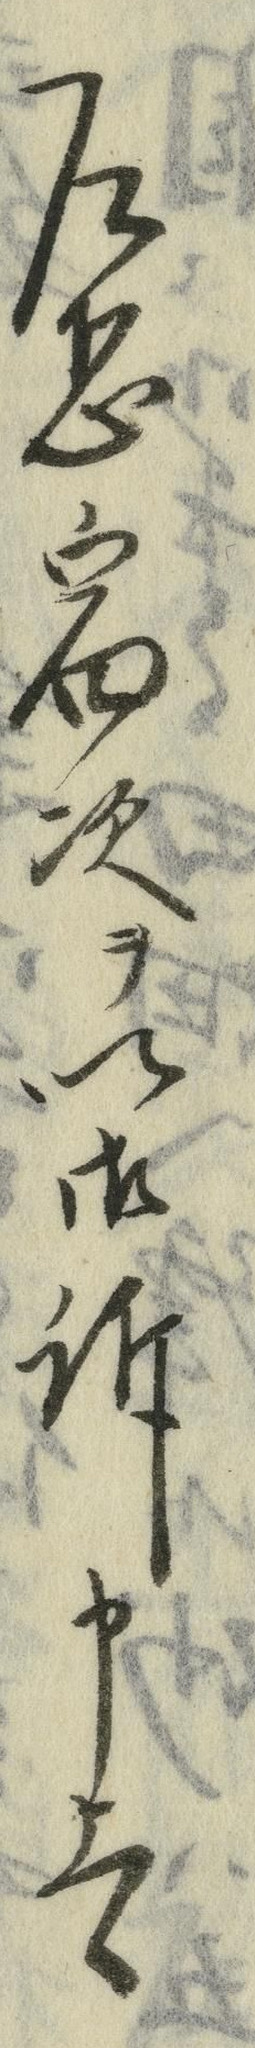乍恐宿次ヲ以御訴申上候
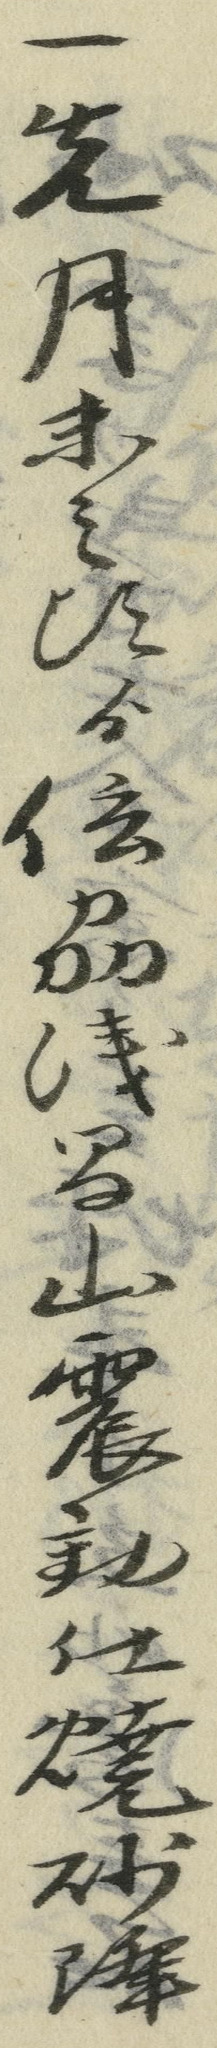一先月末之頃ゟ信州刕浅間山震動仕焼砂降
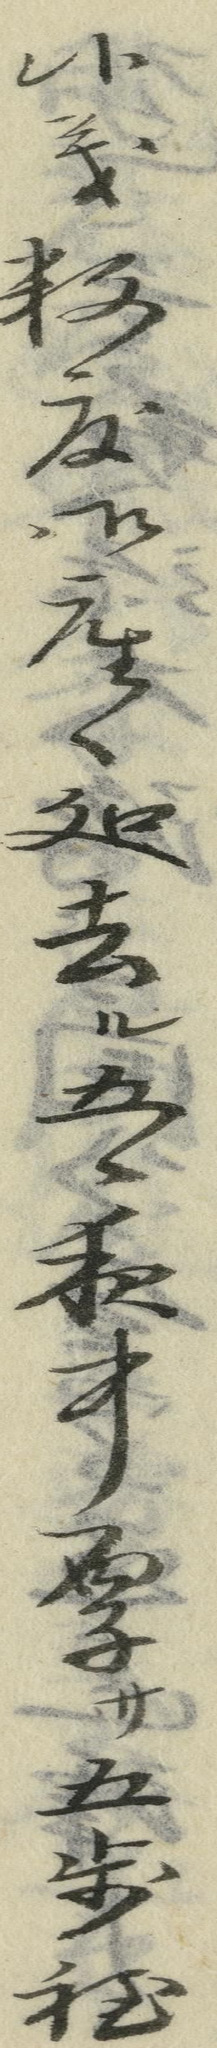候義数度御座候処去ル五日夜中厚サ五歩程
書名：天明三癸卯七月信州浅間山焼出シ上州山津浪ニ付近國ヨリ御届書并訴書写
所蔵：東京大学地震研究所図書室 Earthquake Research Institute Library, The University of Tokyo, JAPAN
